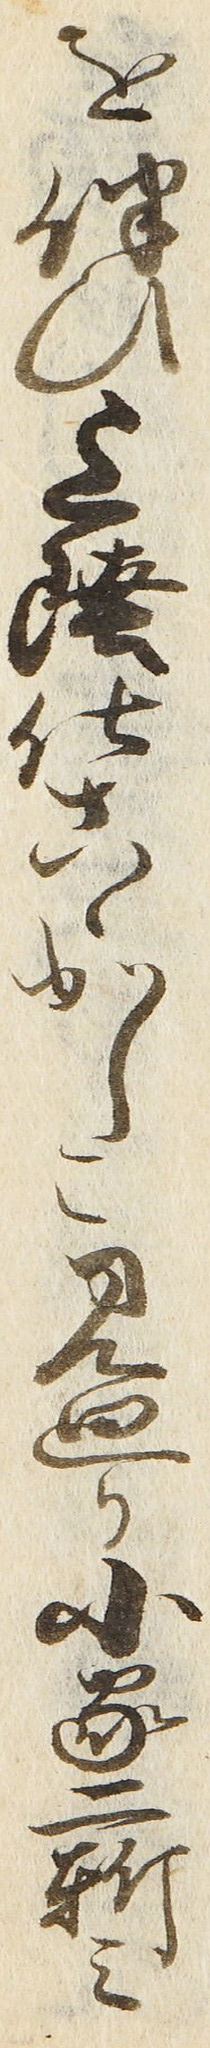ヲ伴ひ上陸仕こゝかしこ見廻り小家二軒ミ
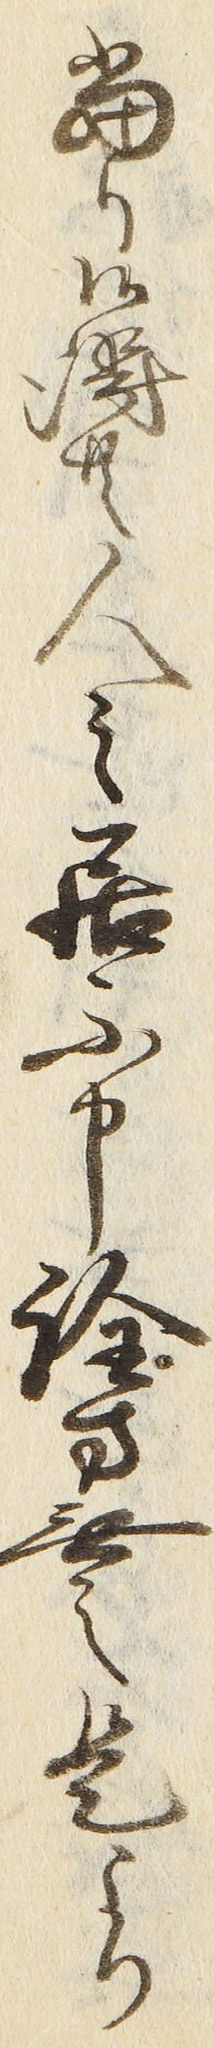當り候得共人之居不申詮方無之是より
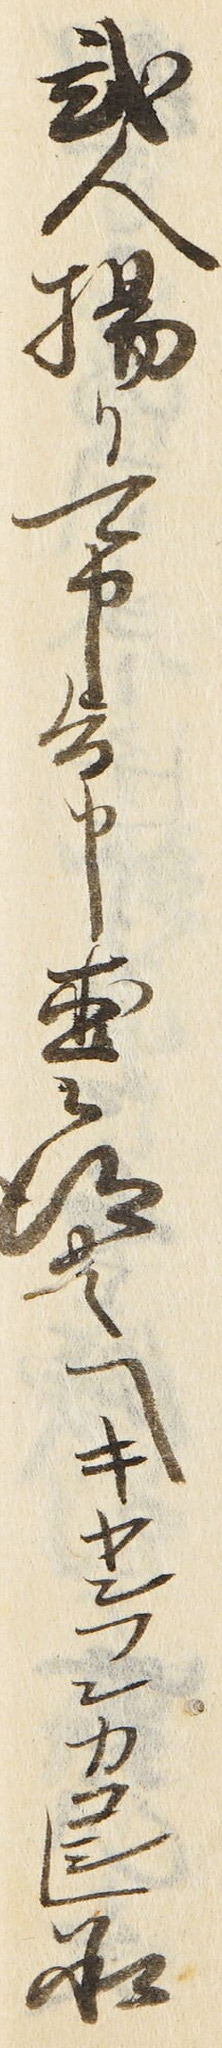弐人揚り可申旨申述候得共「キヤフンカコシ」承
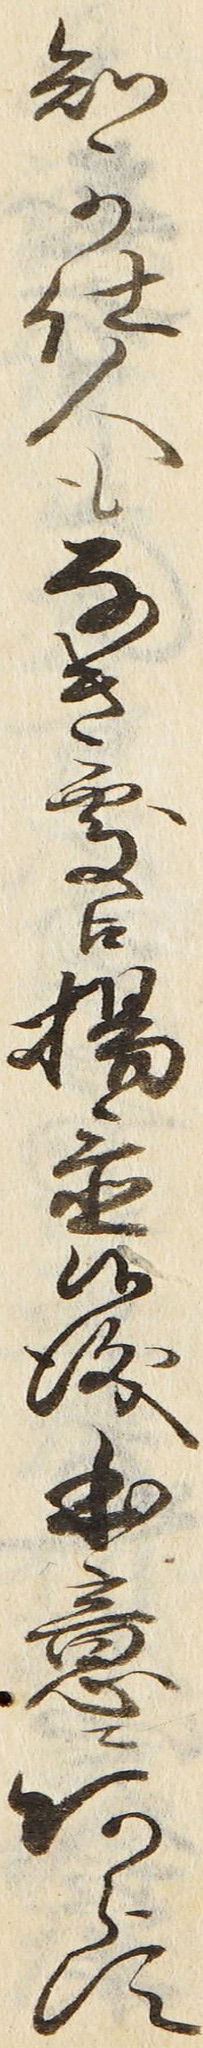知可仕人もなき處江揚置候儀本意ニあらす
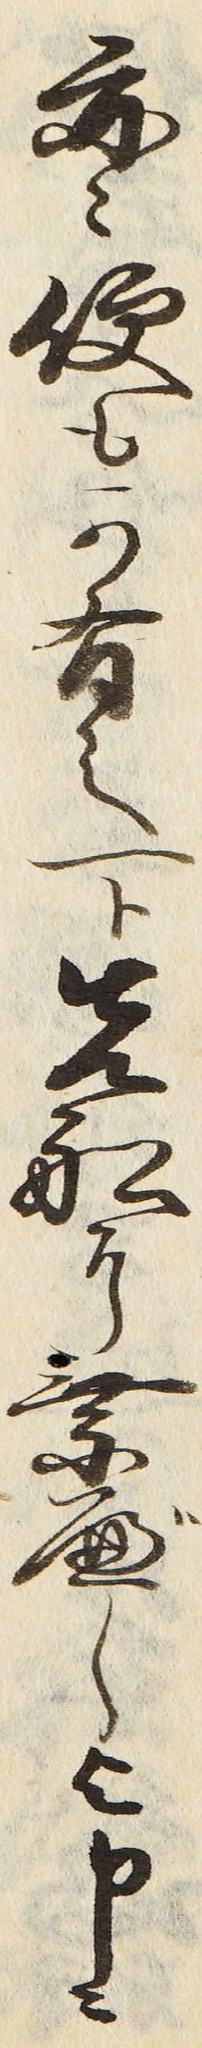亦々便も可有之一ト先舩に乗べと申ニ
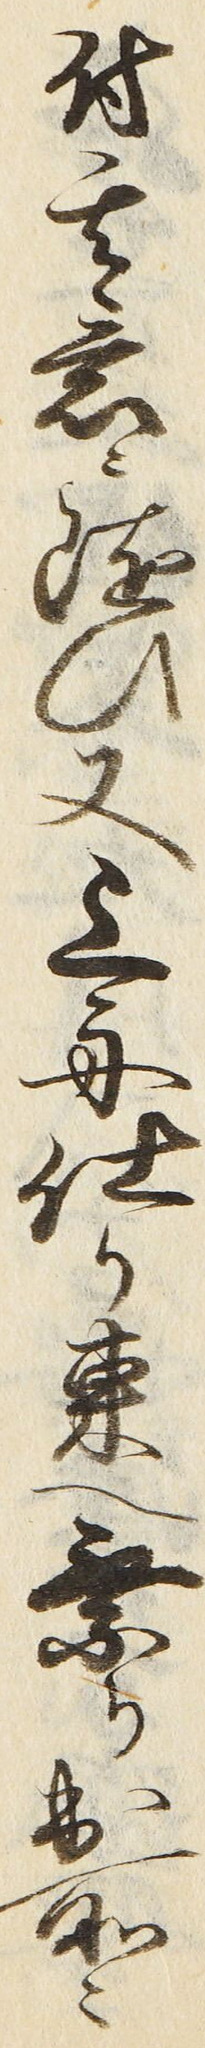付其意ニ随ひ又上舟仕り東へ乗り出所々
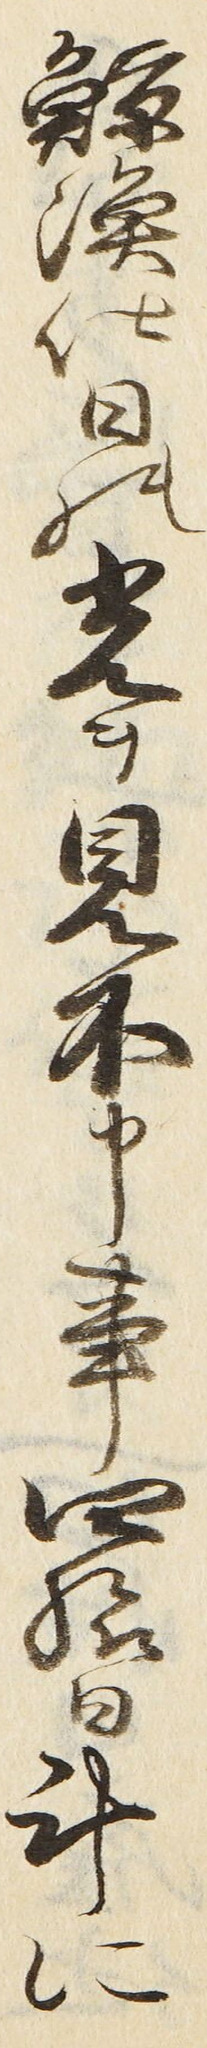鯨漁仕日の光ヲ見不申事四拾日斗に
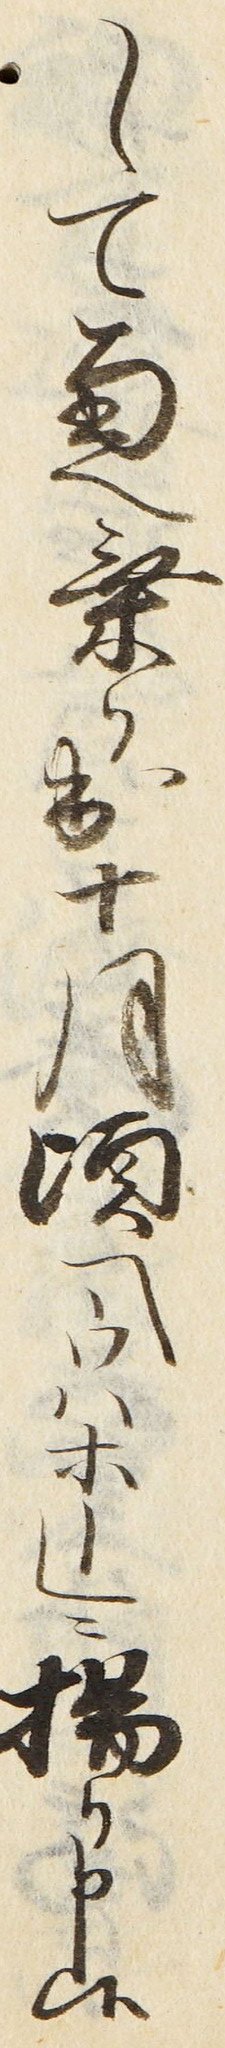して南へ乗り出十月頃「ウハホー」ニ揚り申候
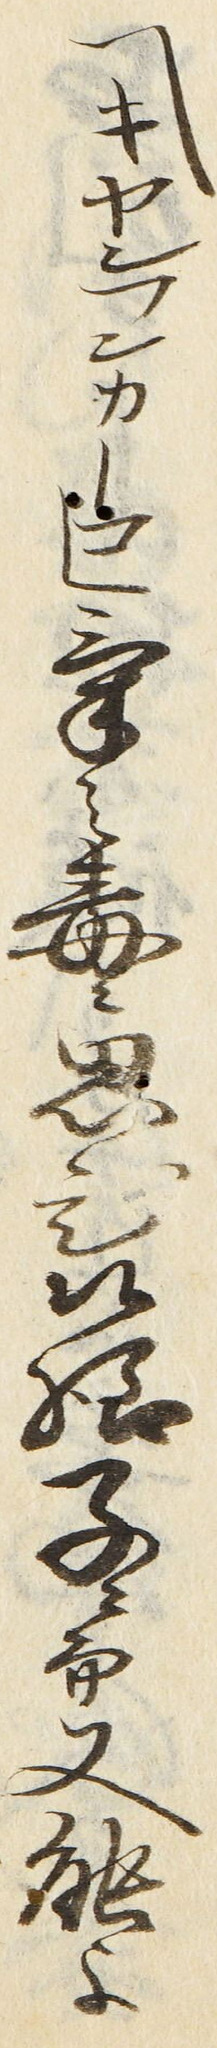「キヤフンカーコ」氣之毒ニ思ひ候様子ニ而又能き
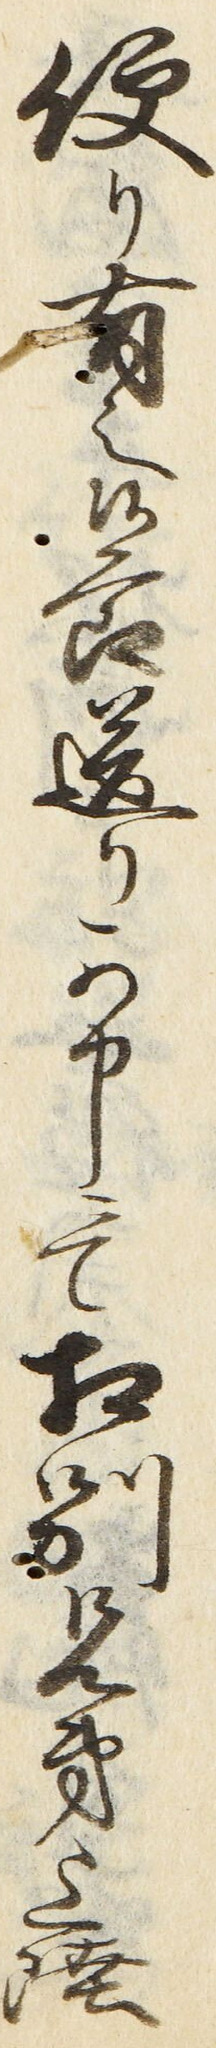便り有之候節送り可申ニて相別兄弟上陸
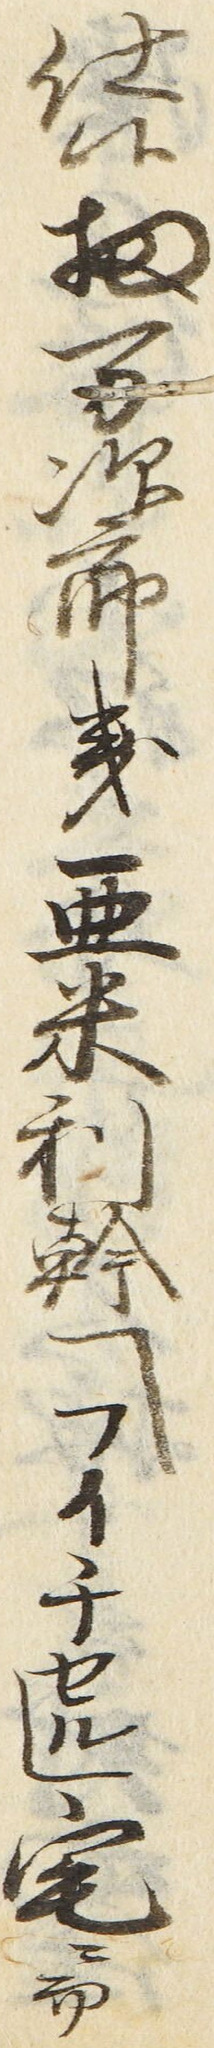仕候扨万次郎義亜米利幹「フイチセル」宅ニ而
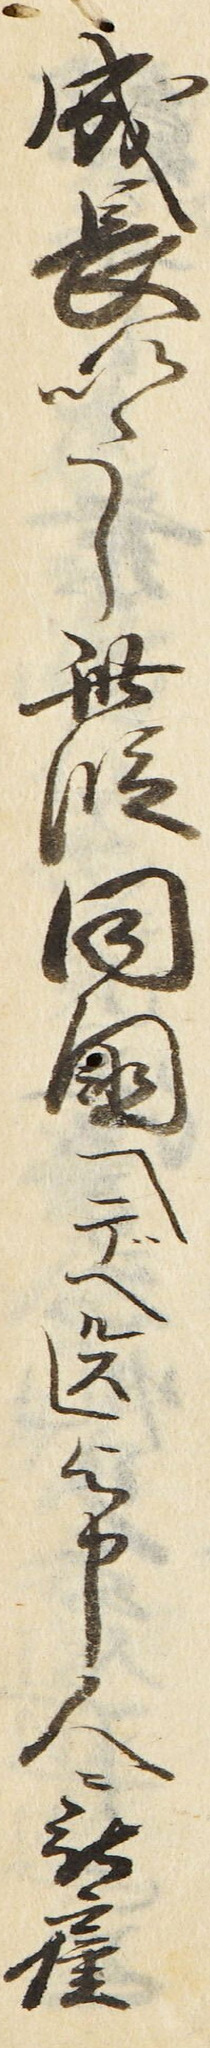成長いたし此段同國「デヘルス」と申人ニ被雇

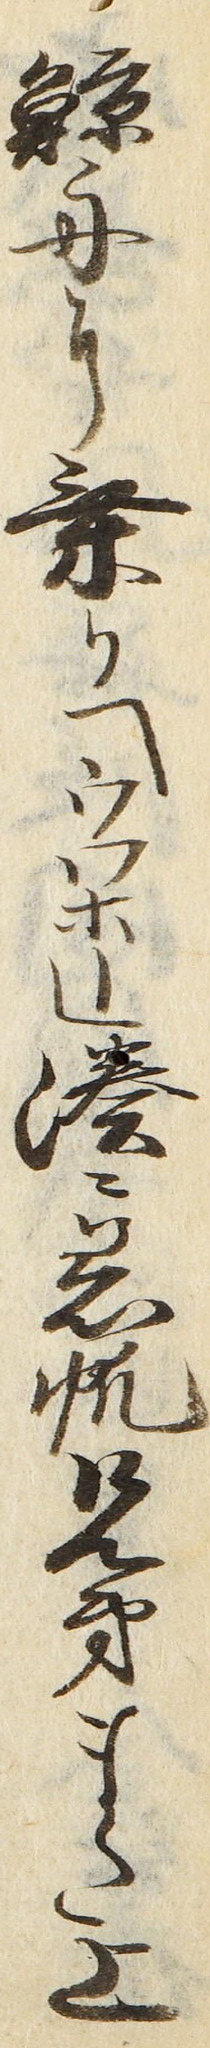鯨舟に乗り「ウワホー」湊ニ着帆兄弟また上
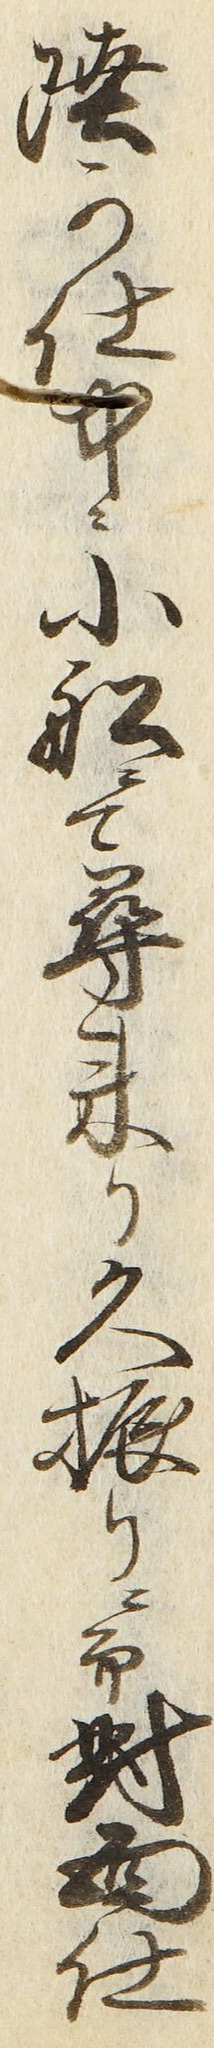陸可仕中ニ小舩ニて尋来り久振りニ而對面仕
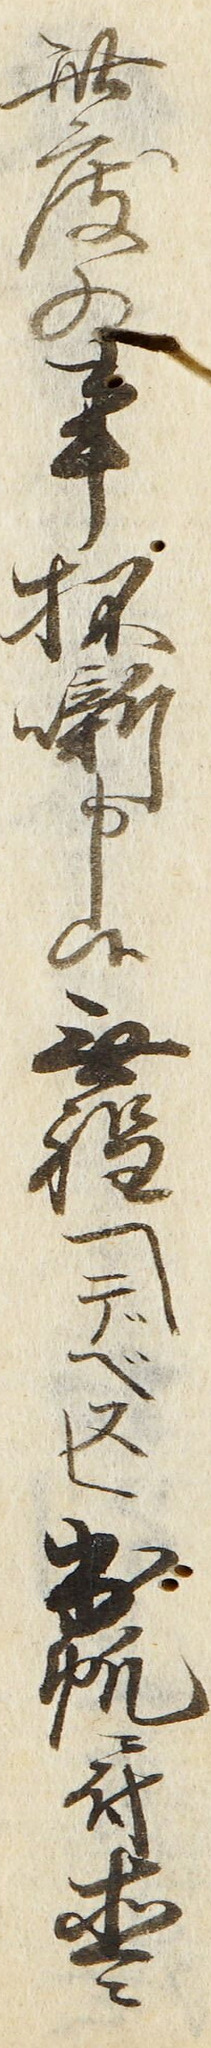此度の事抔噺申候無程「デべス」出帆ニ付直ニ
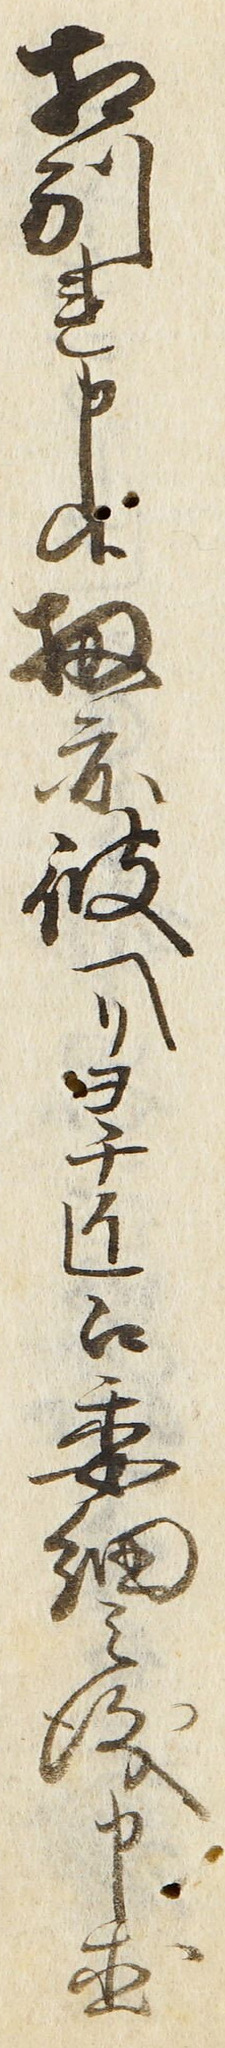相別れ申候扨亦彼「リヨチイ」江委細之儀申述
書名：漂客談寄
